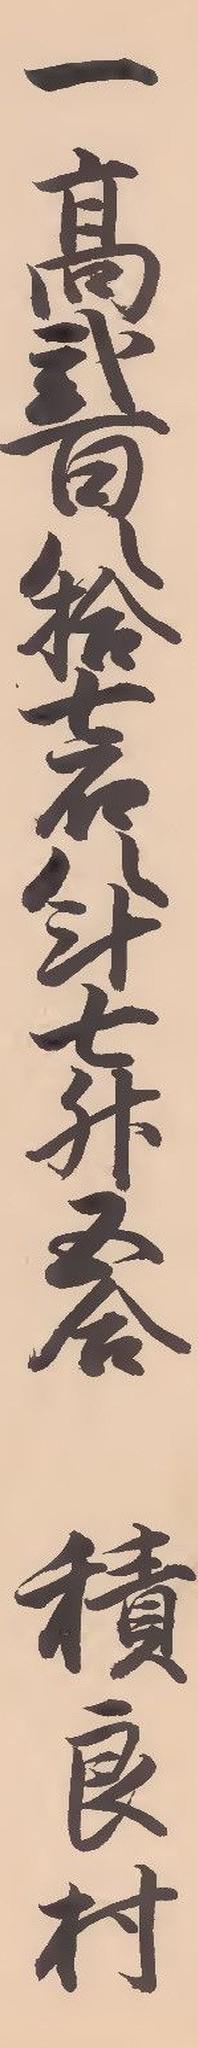一高弐百八拾七石八斗七升五合積良村
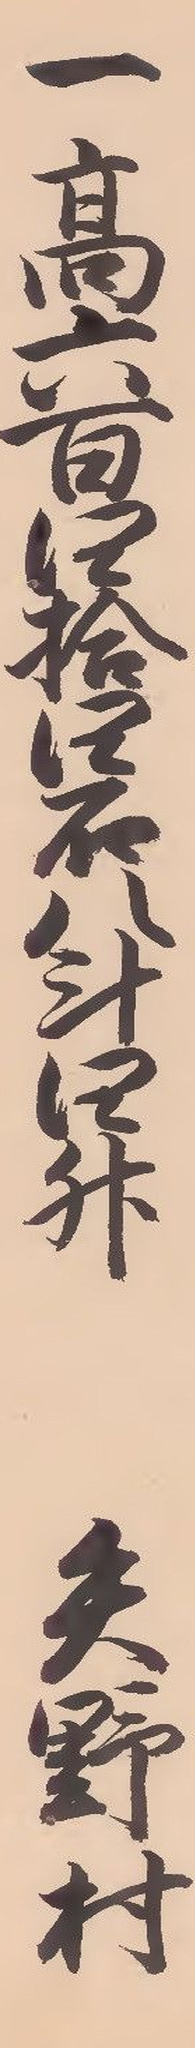一高六百四拾四石八斗四升矢野村

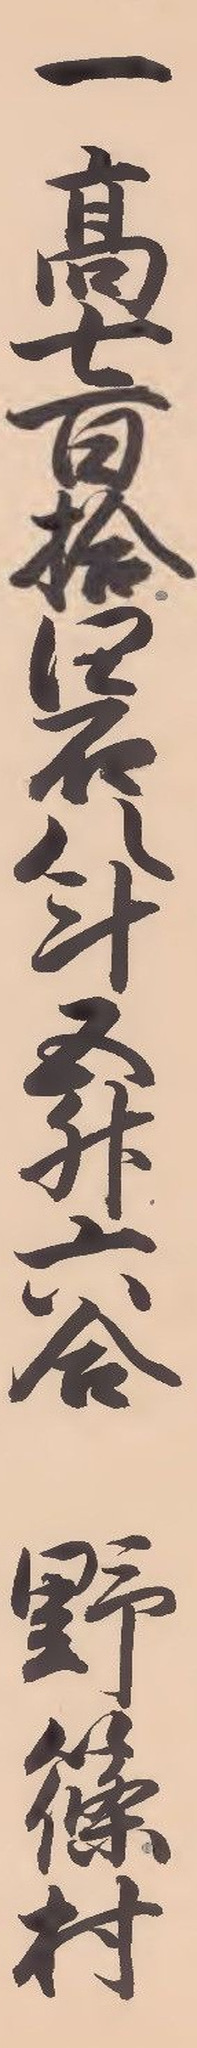一高七百拾四石八斗五升六合野篠村
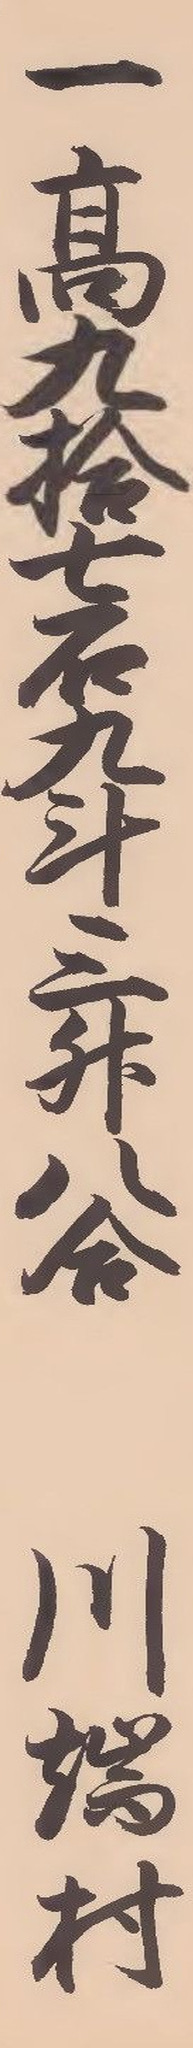一高九拾七石九斗三升八合川端村
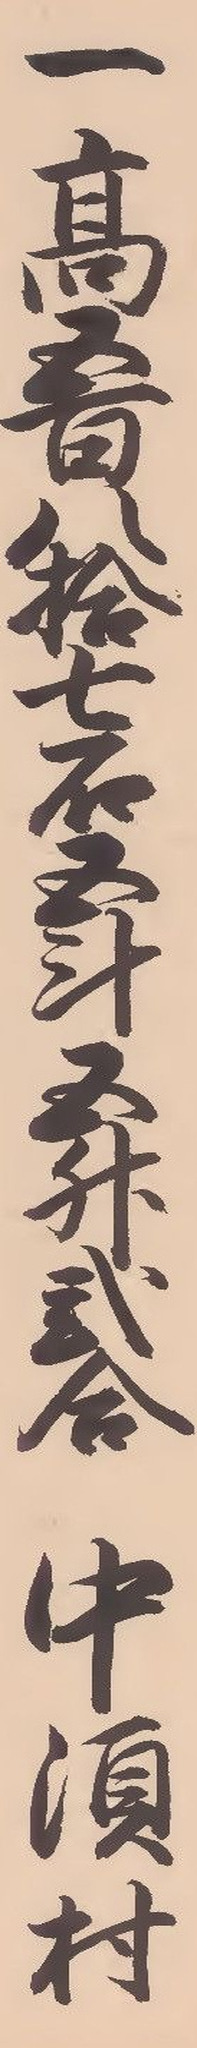一高五百八拾七石五斗五升弐合中須村
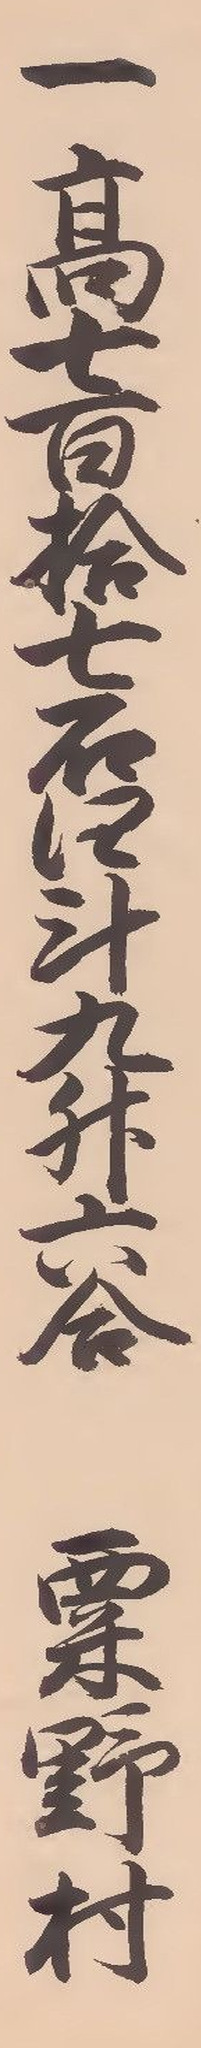一高七百拾七石四斗九升六合粟野村

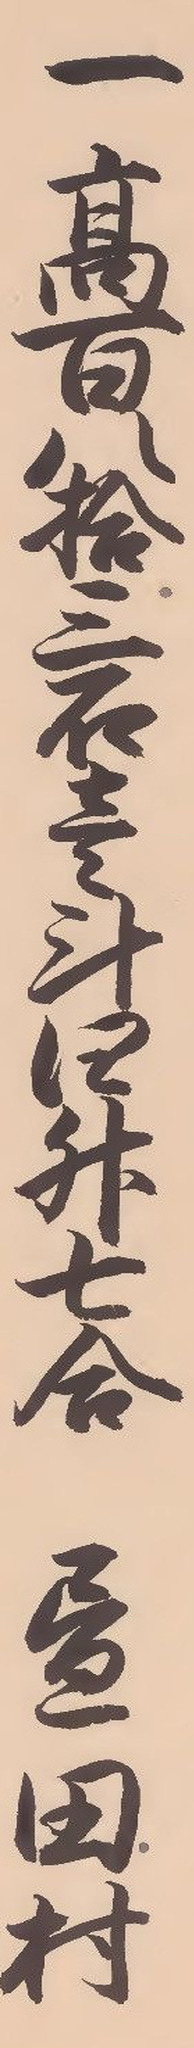一高百八拾三石壱斗四升七合昼田村
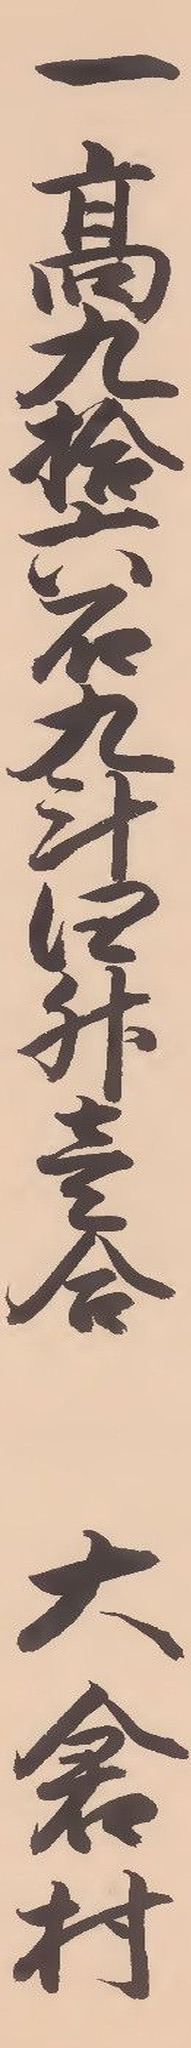一高九拾六石九斗四升壱合大倉村
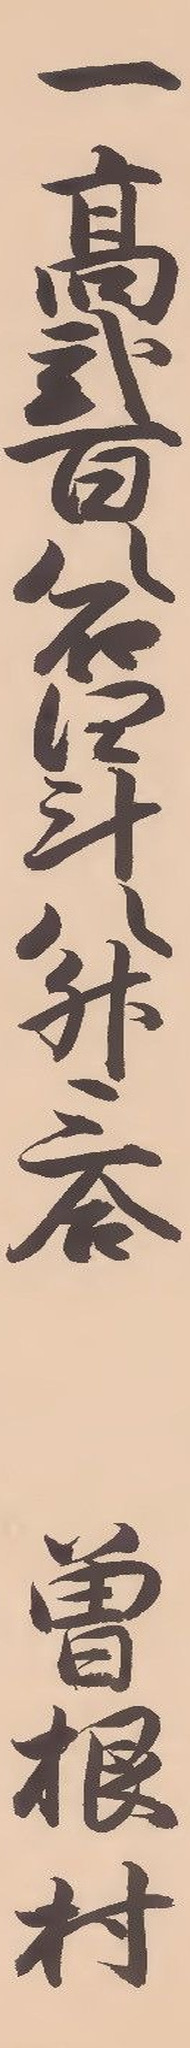一高弐百八石四斗八升三合曽根村
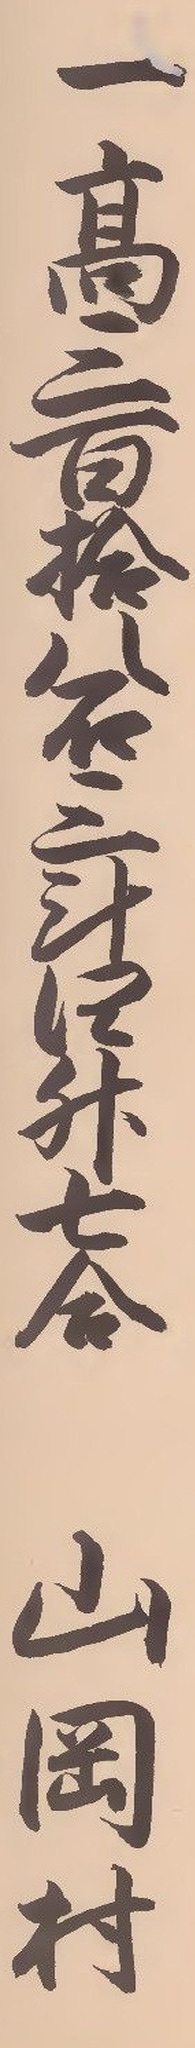一高三百拾八石三斗四升七合山岡村
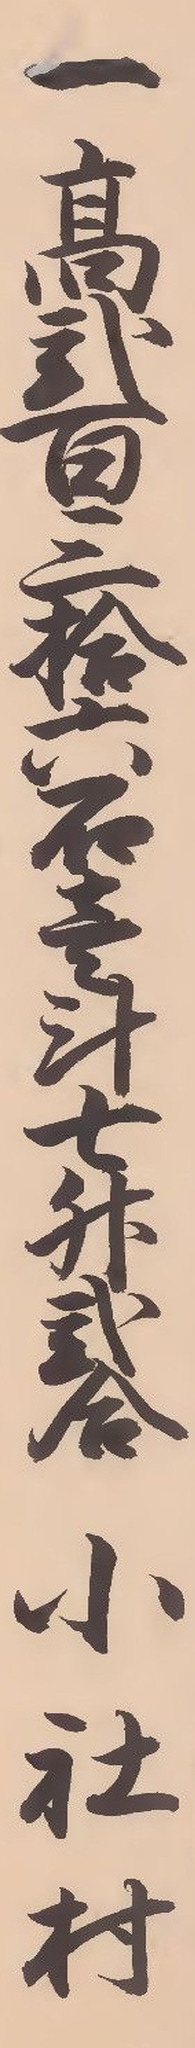一高弐百三拾六石壱斗七升弐合小社村
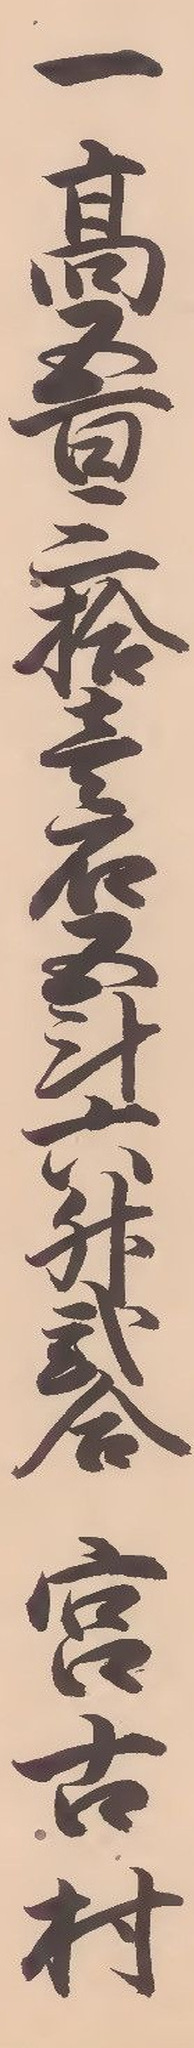一高五百三拾壱石五斗六升弐合宮古村

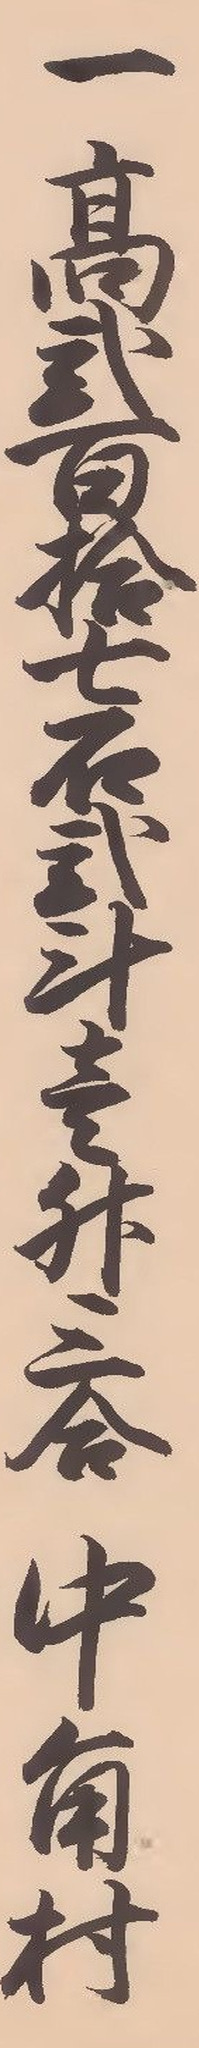一高弐百拾七石弐斗壱升三合中角村
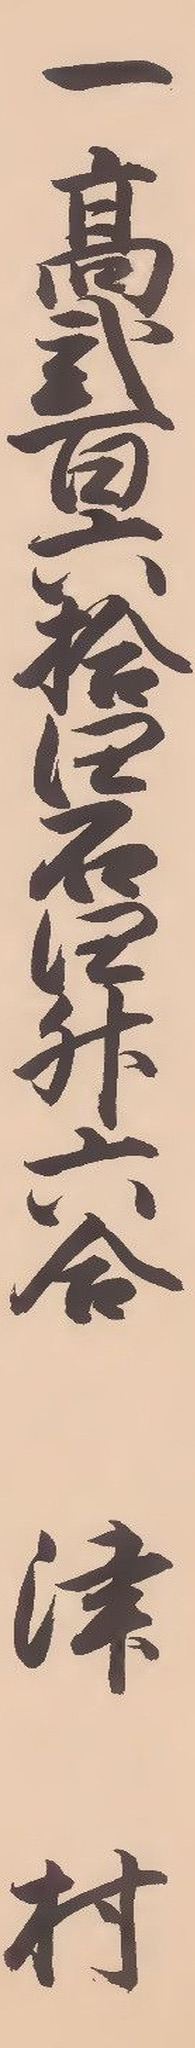一高弐百六拾四石四升六合津村
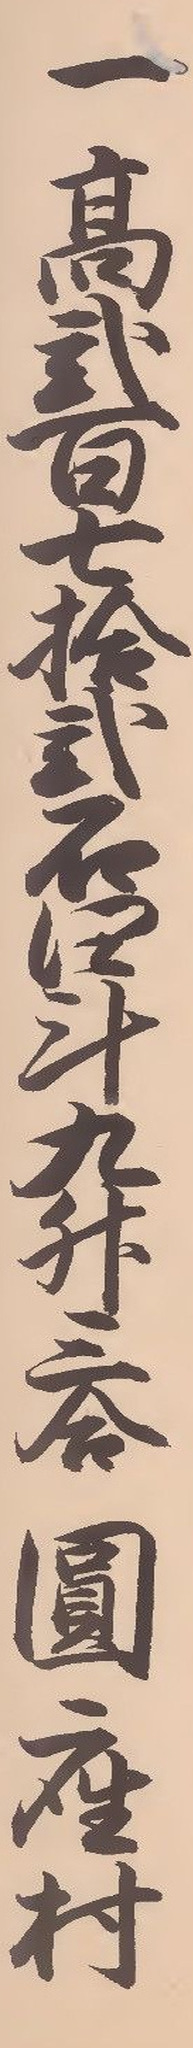一高弐百七拾弐石四斗九升三合円座村
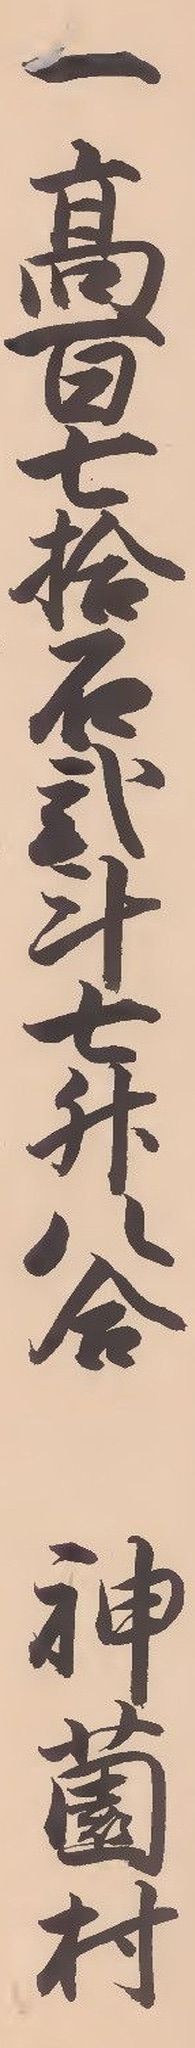一高百七拾石弐斗七升八合神薗村
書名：伊勢国郷帳
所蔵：国立公文書館 National Archives of Japan
